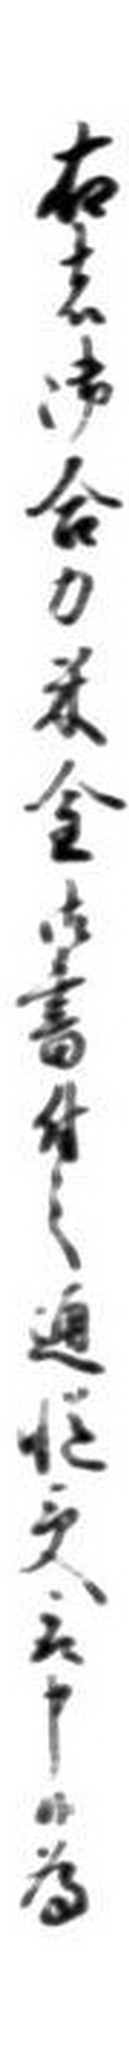右者御合力米金御書付之通慥受取申候為
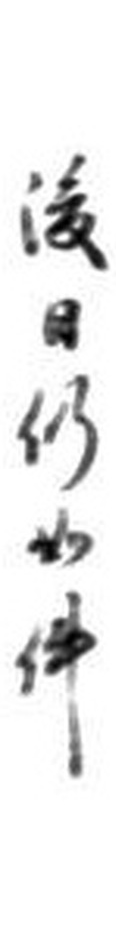後日仍如件
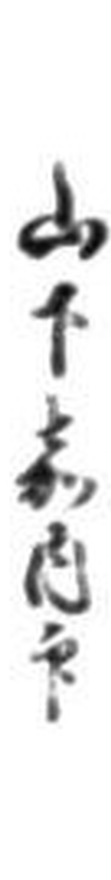山下嘉内印
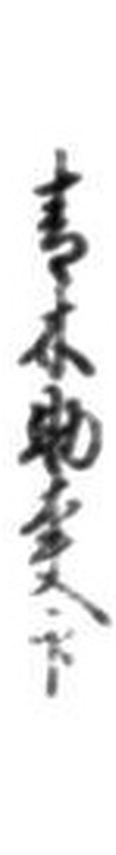青木助太夫印
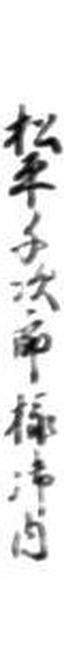松平千次郎様御内
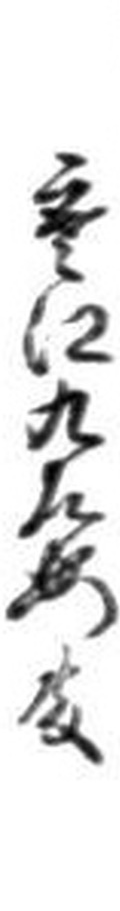寒江九左衛門殿

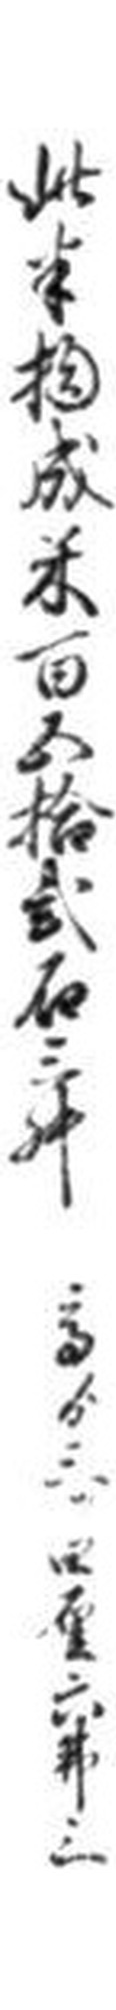此半物成米百五拾弐石三升高ゟ三ツ四厘六弗三
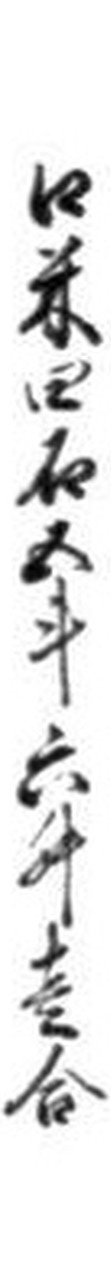口米四石五斗六升壱合
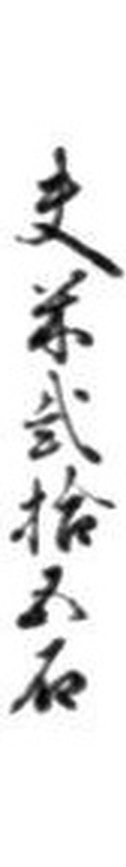夫米弐拾五石
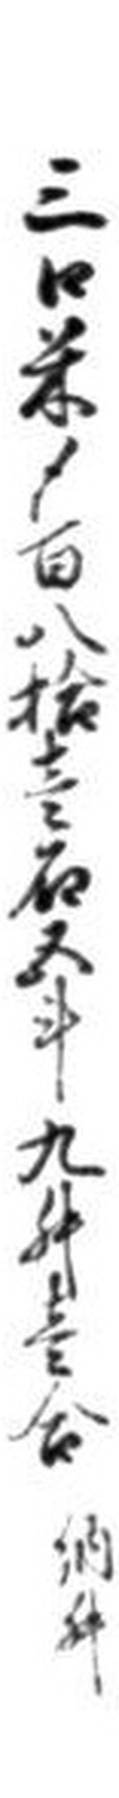三口米〆百八拾壱石五斗九升壱合納升
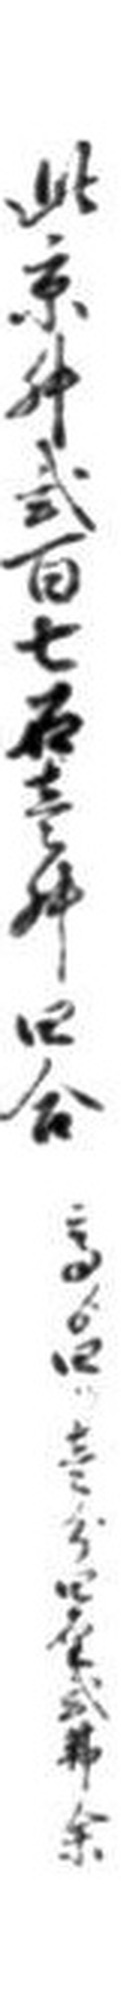此京升弐百七石壱升四合高ゟ四ツ壱分四厘弐弗余
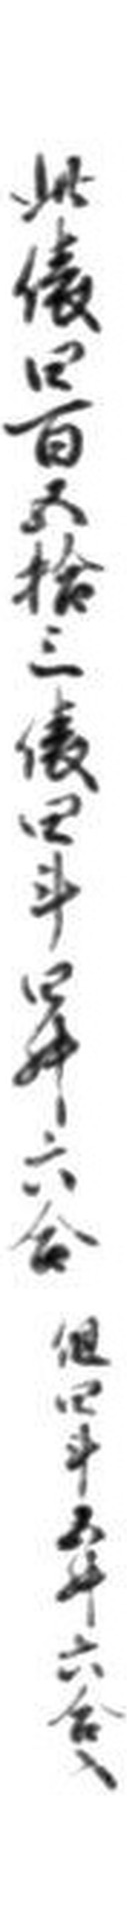此俵四百五拾三俵四斗四升六合但四斗五升六合入
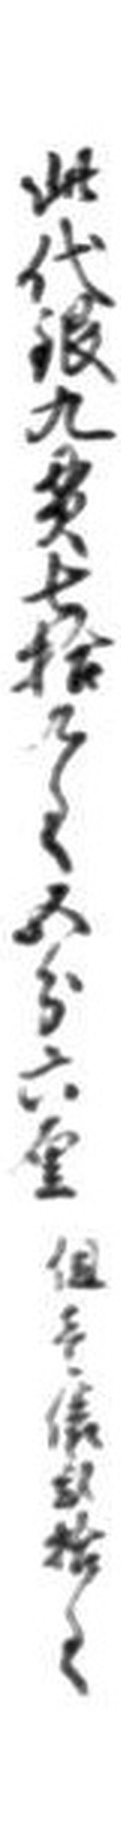此代銀九貫七拾九匁五分六厘但壱俵歟拾匁
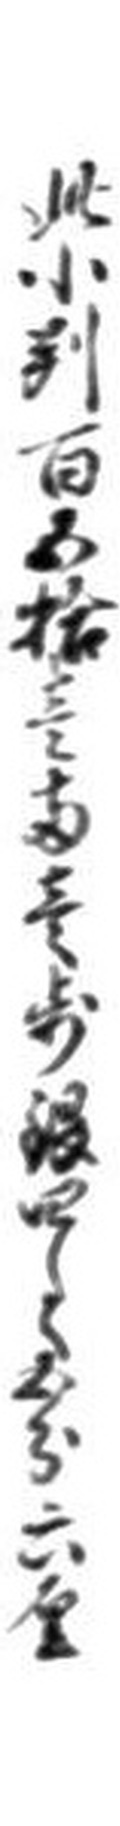此小判百五拾壱両壱歩銀四匁五分六厘
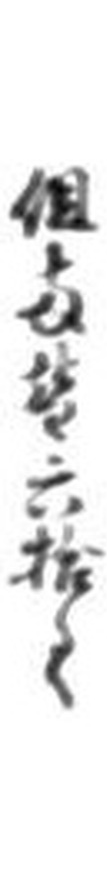但両替六拾匁
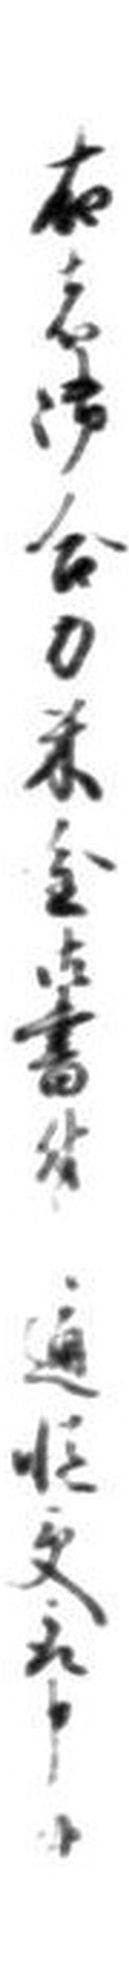右者御合力米金御書付之通慥受取申候
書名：家譜 三十九 宗矩公 享保十年
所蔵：福井県文書館 Fukui Prefectural Archives
